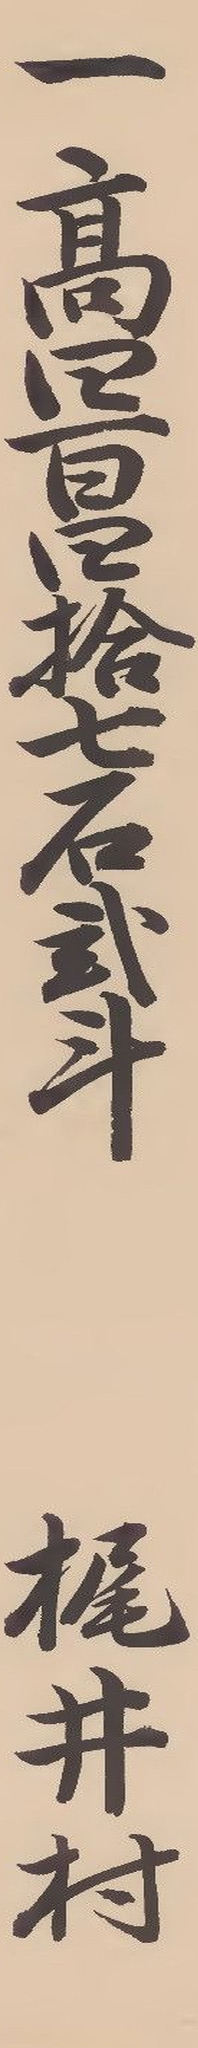一高四百四拾七石弐斗梶井村
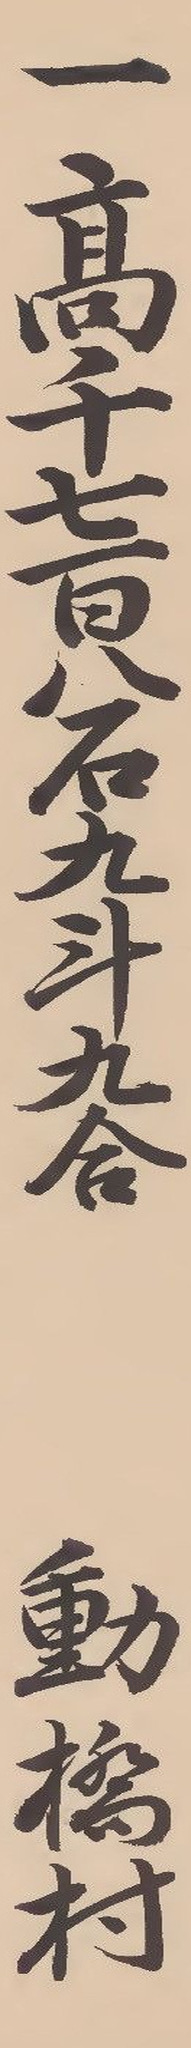一高千七百八石九斗九合動橋村
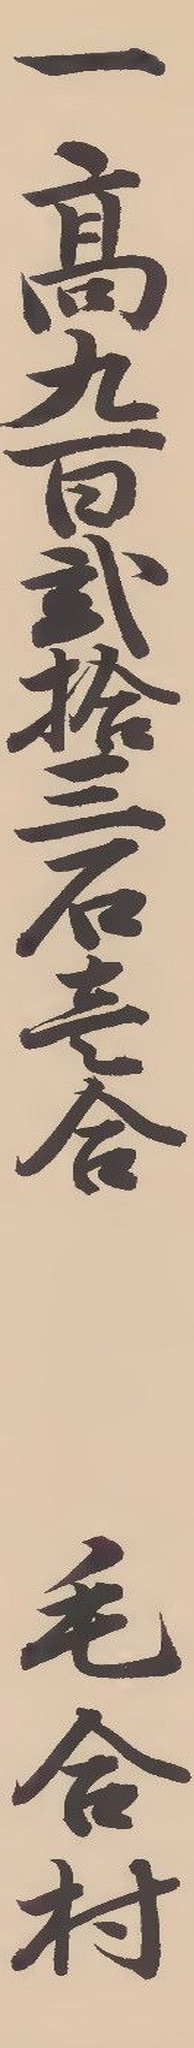一高九百弐拾三石壱合毛合村
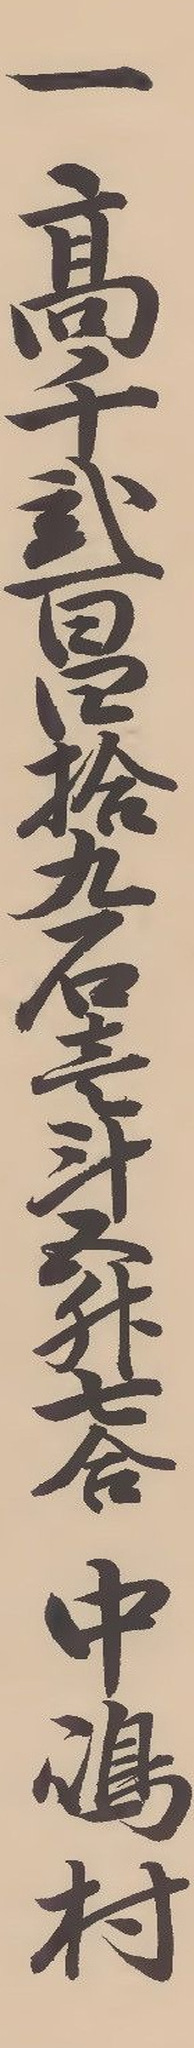一高千弐百四拾九石壱斗五升七合中島村
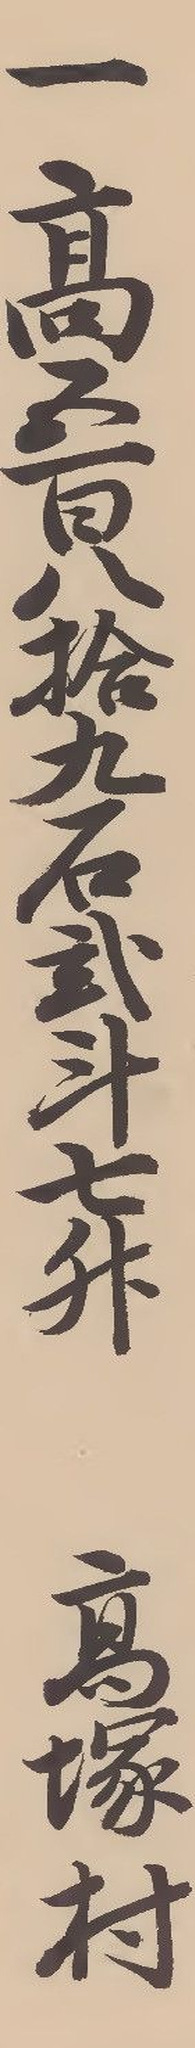一高五百八拾九石弐斗七升高塚村
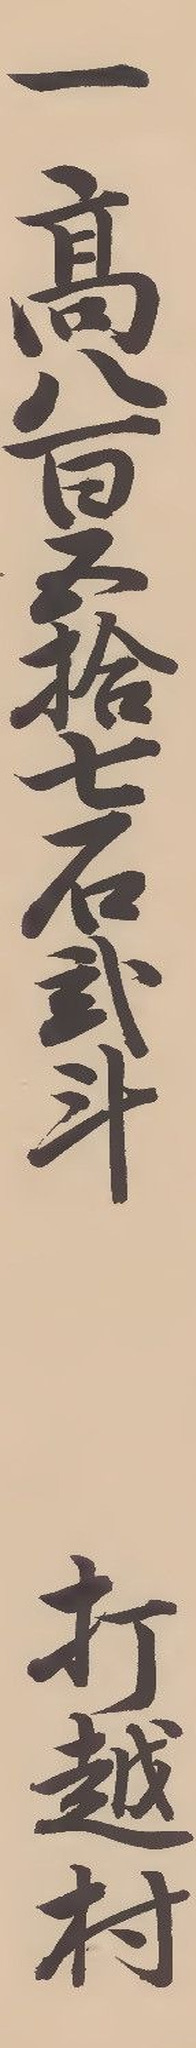一高八百五拾七石弐斗打越村
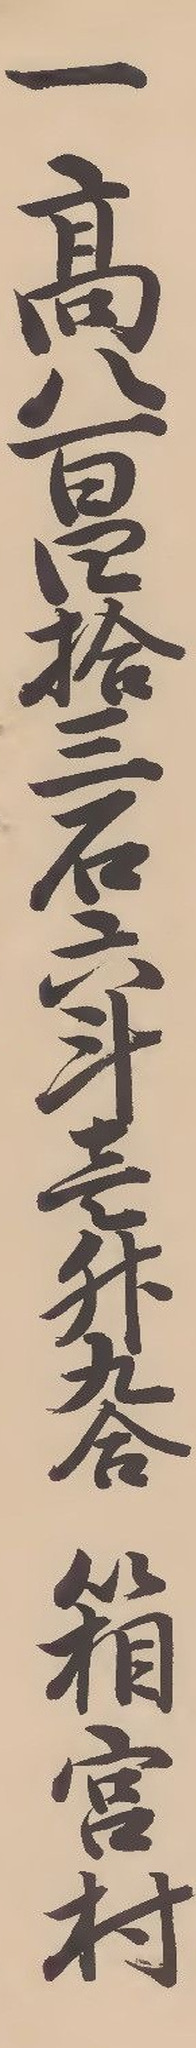一高八百四拾三石六斗壱升九合箱宮村

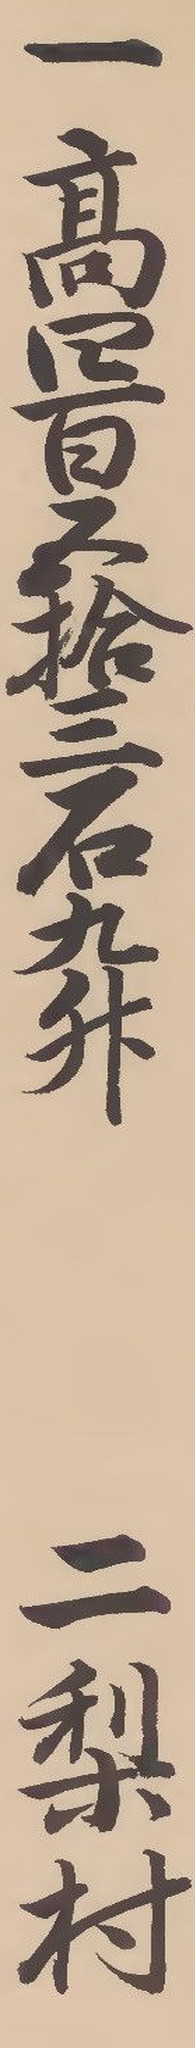一高四百五拾三石九升二梨村
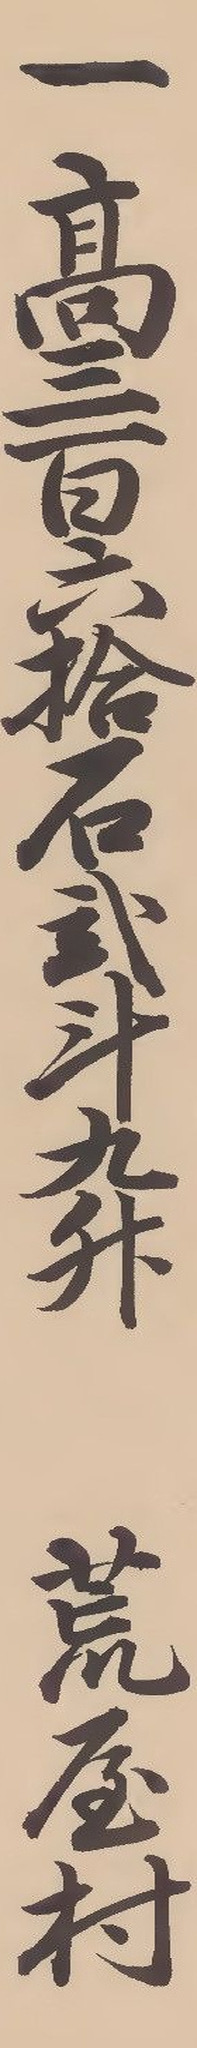一高三百六拾石弐斗九升荒屋村
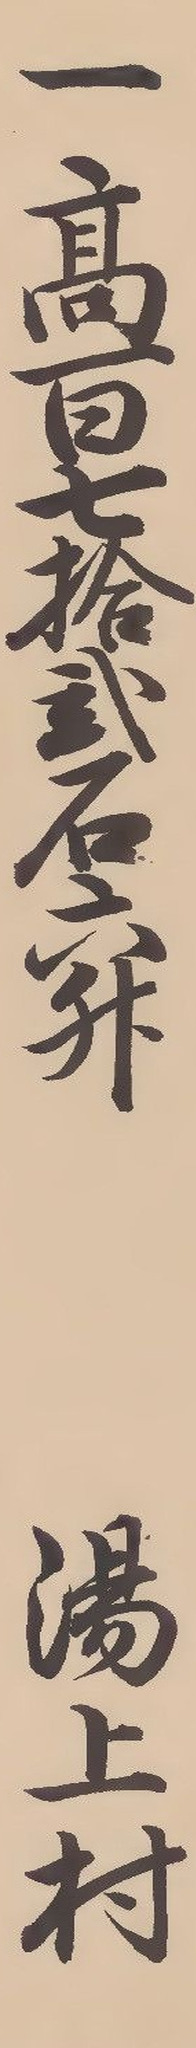一高百七拾弐石六升湯上村
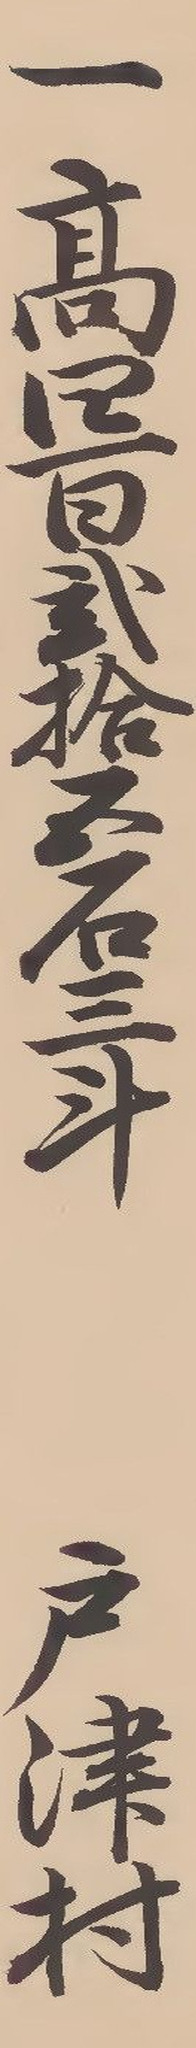一高四百弐拾五石三斗戸津村
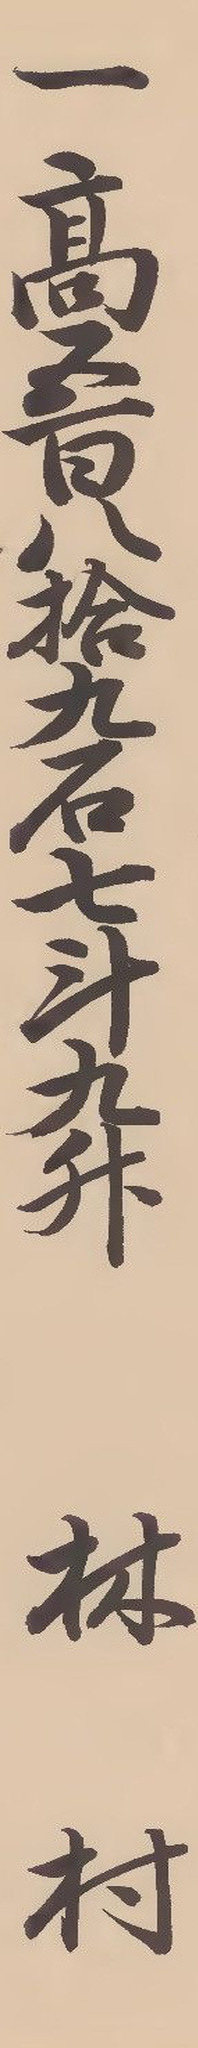一高五百八拾九石七斗九升林村
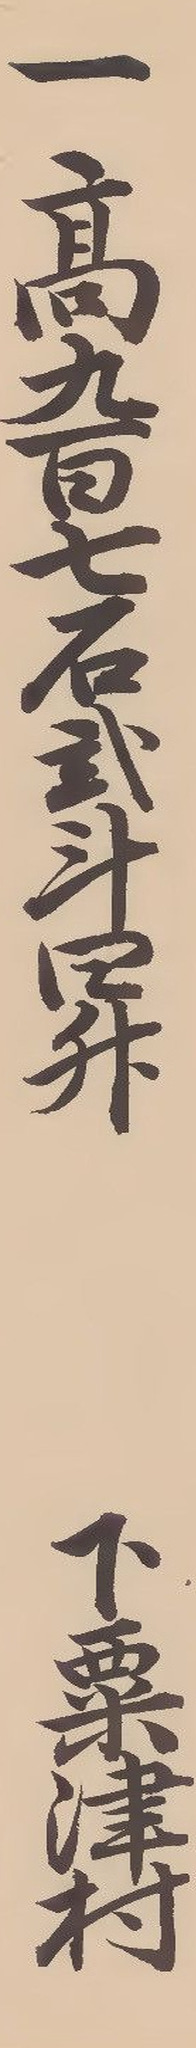一高九百七石弐斗四升下粟津村
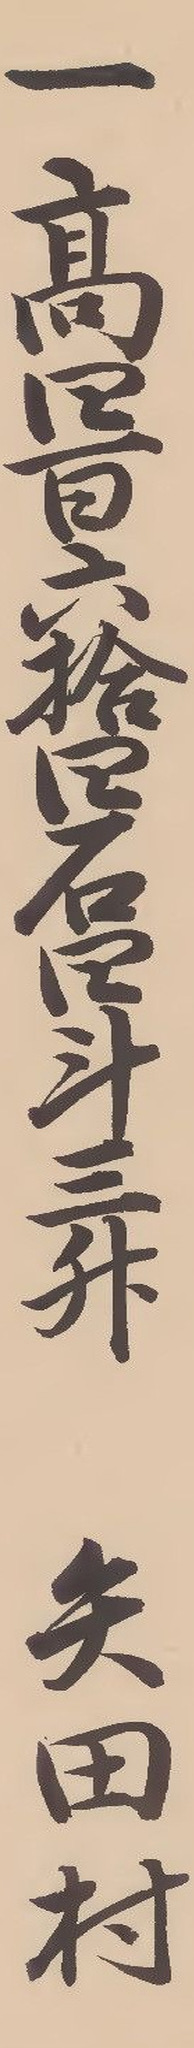一高四百六拾四石四斗三升矢田村
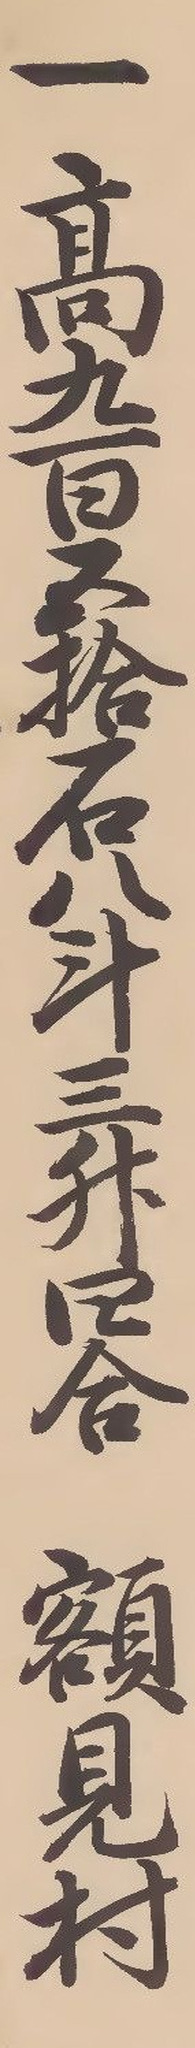一高九百五拾石八斗三升四合額見村

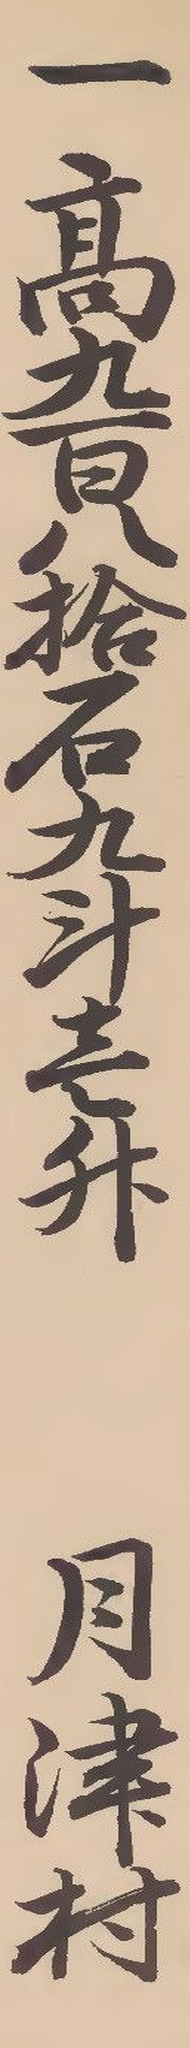一高九百八拾石九斗壱升月津村
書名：加賀国郷帳
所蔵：国立公文書館 National Archives of Japan
